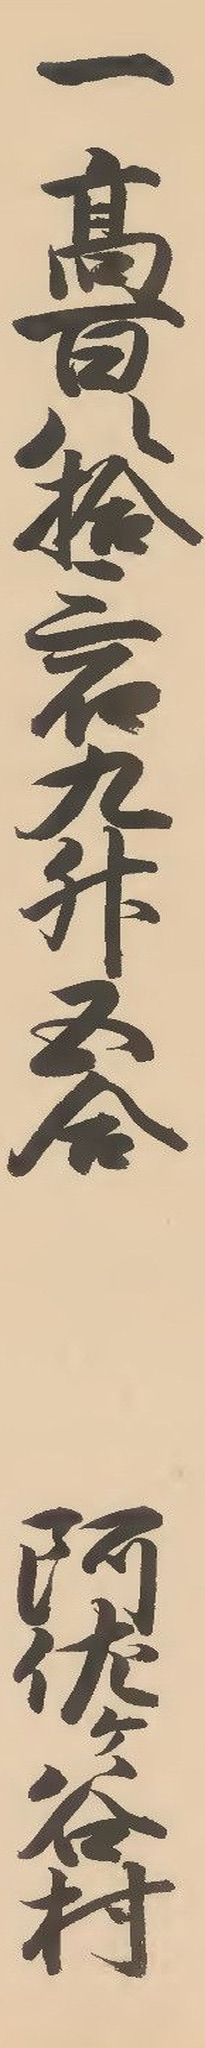一高百八拾三石九升五合阿佐ヶ谷村
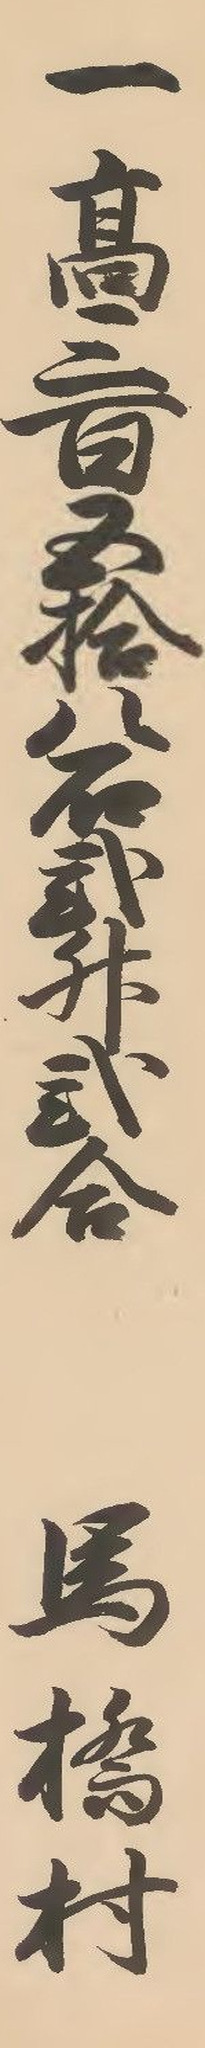一高三百五拾八石弐升弐合馬橋村
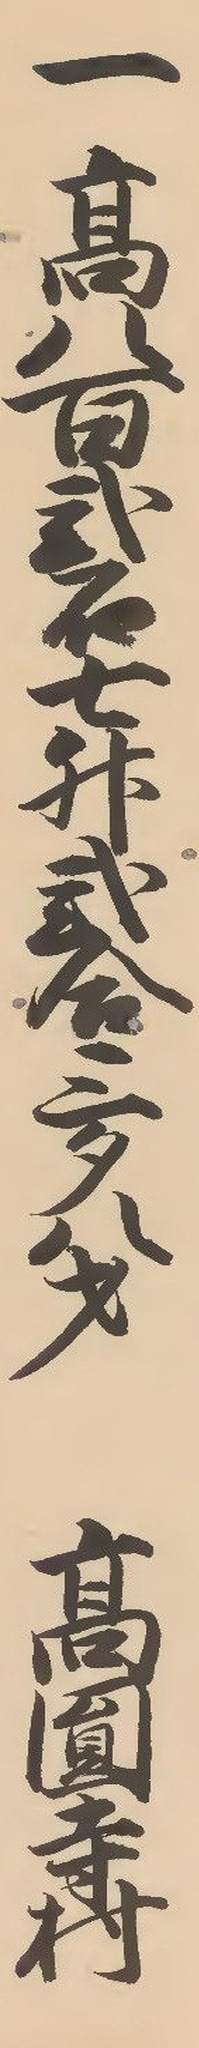一高八百弐石七升弐合三勺八才高円寺村

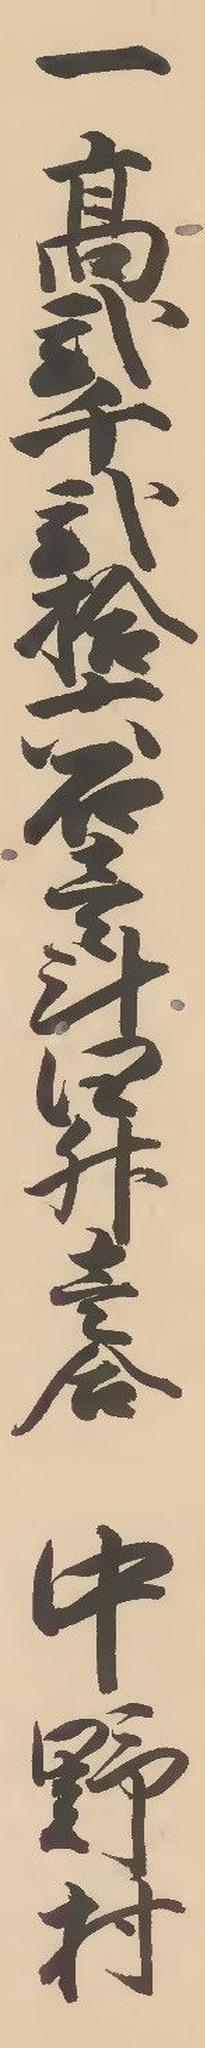一高弐千弐拾六石壱斗四升壱合中野村
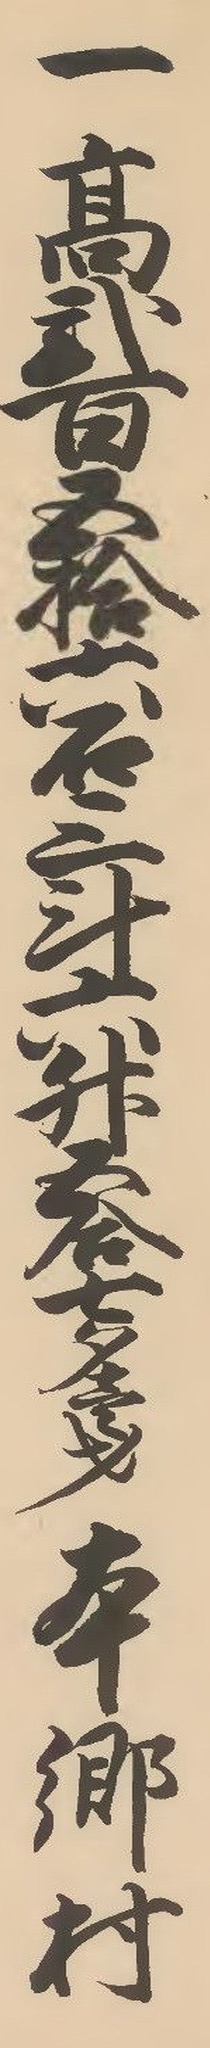一高弐百五拾六石三斗六升五合七勺壱才本郷村
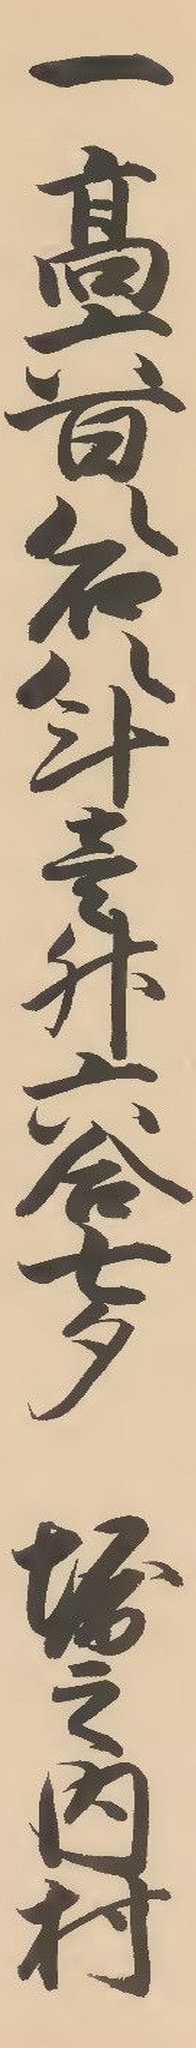一高六百八石八斗壱升六合七勺堀之内村
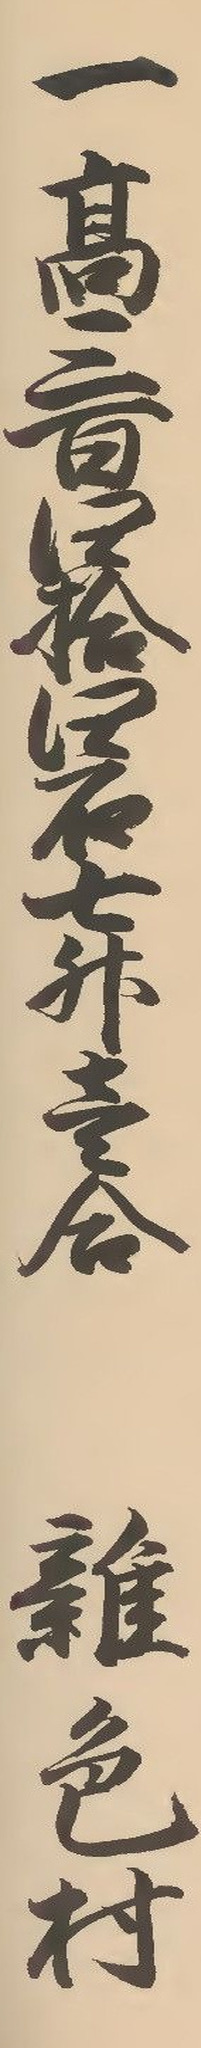一高三百四拾四石七升壱合雑色村
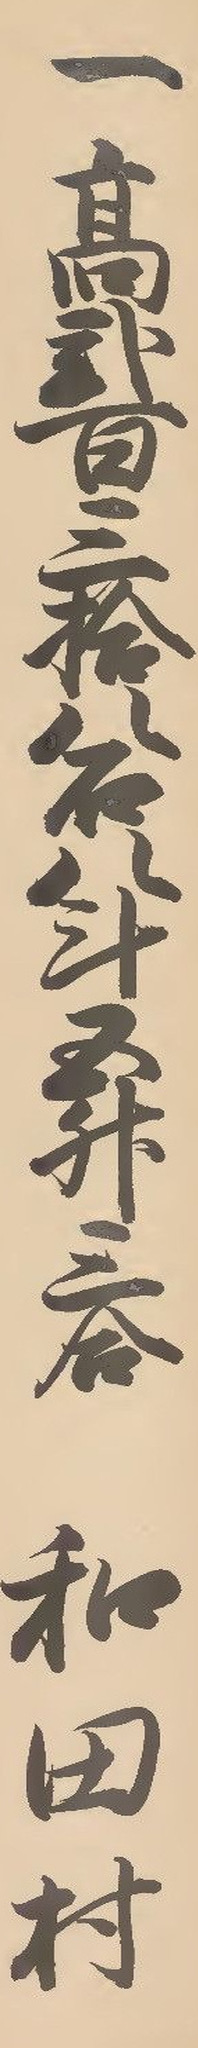一高弐百三拾八石八斗五升三合和田村
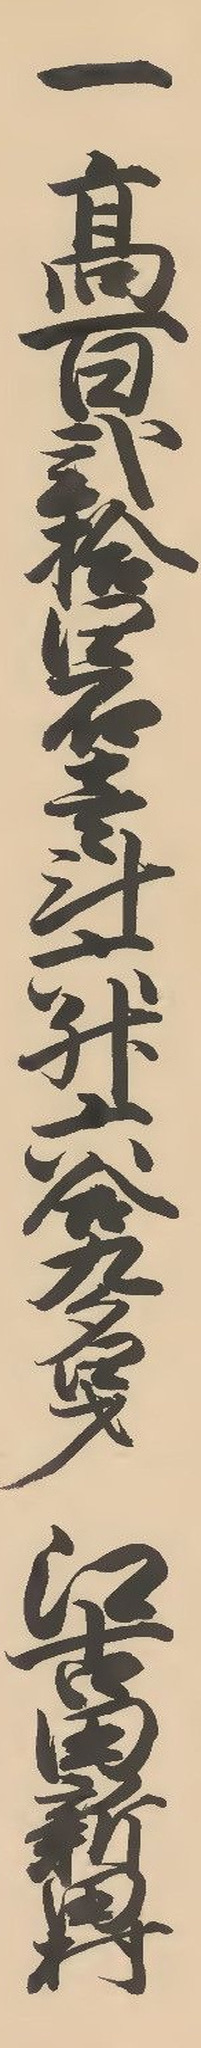一高百弐拾四石壱斗六升九勺四才江古田新田
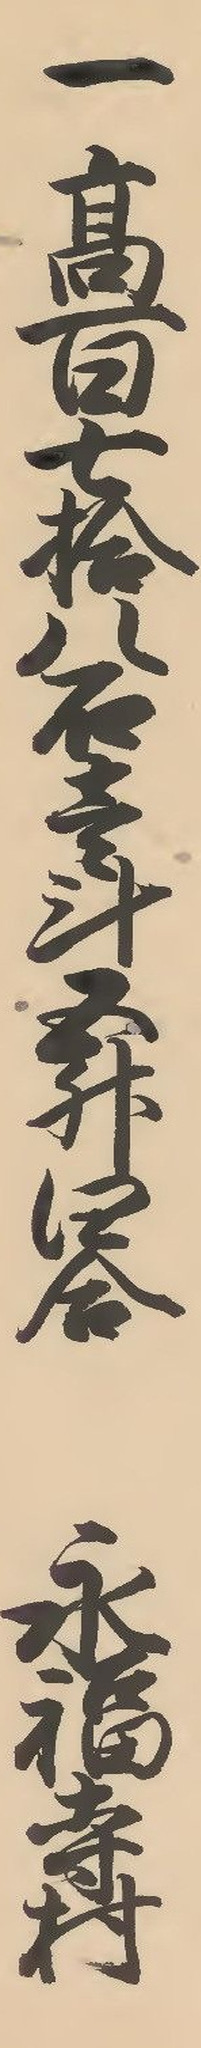一高百七拾八石壱斗五升四合永福寺村

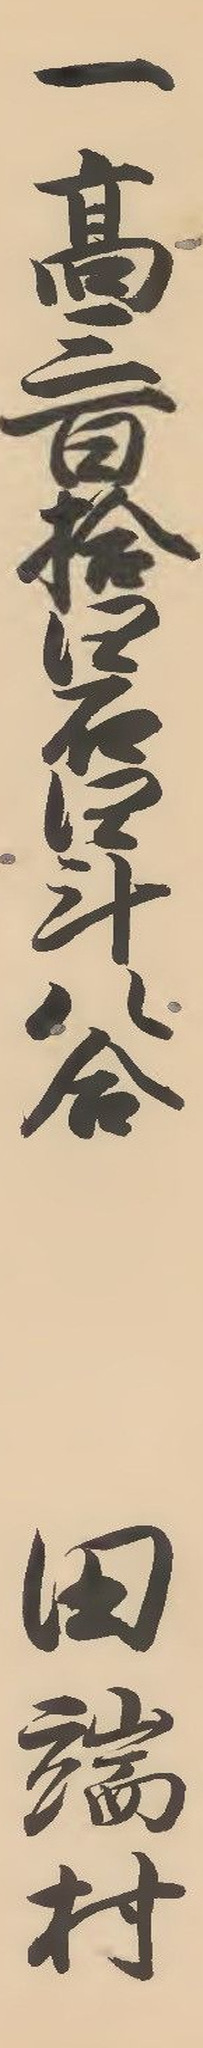一高三百拾四石四斗八合田端村
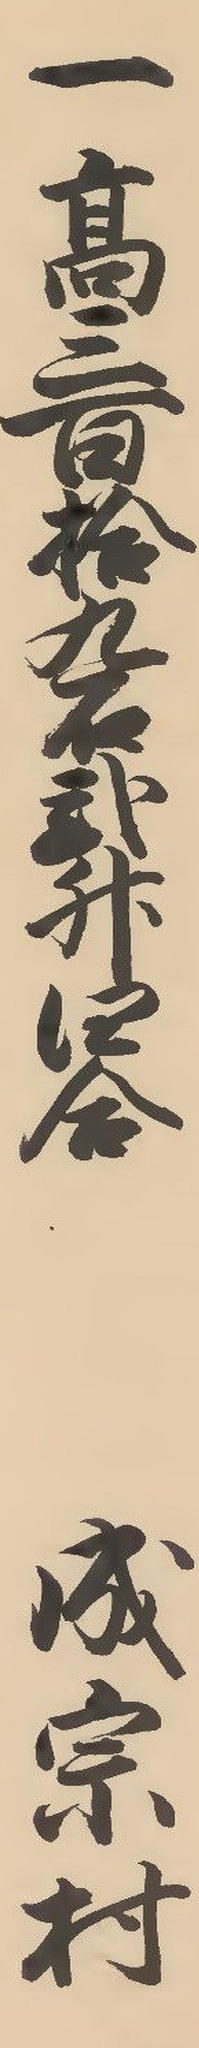一高三百拾九石弐升四合成宗村
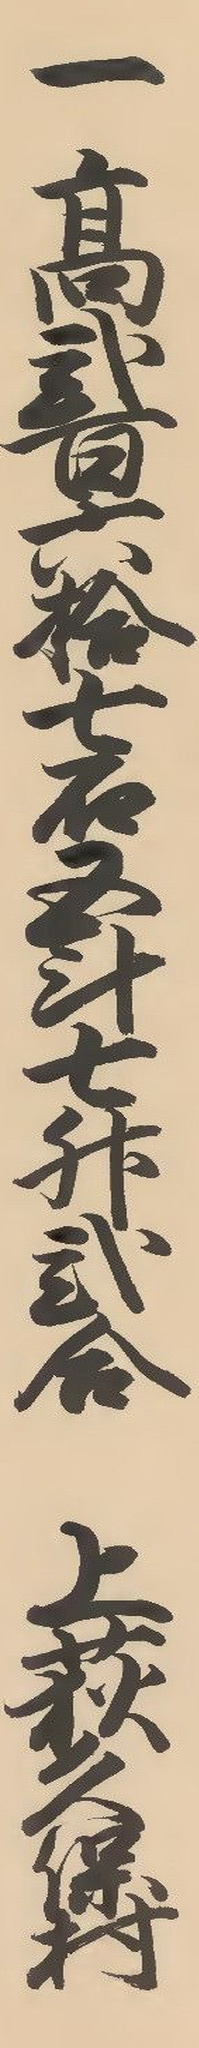一高弐百六拾七石五斗七升弐合上萩久保村
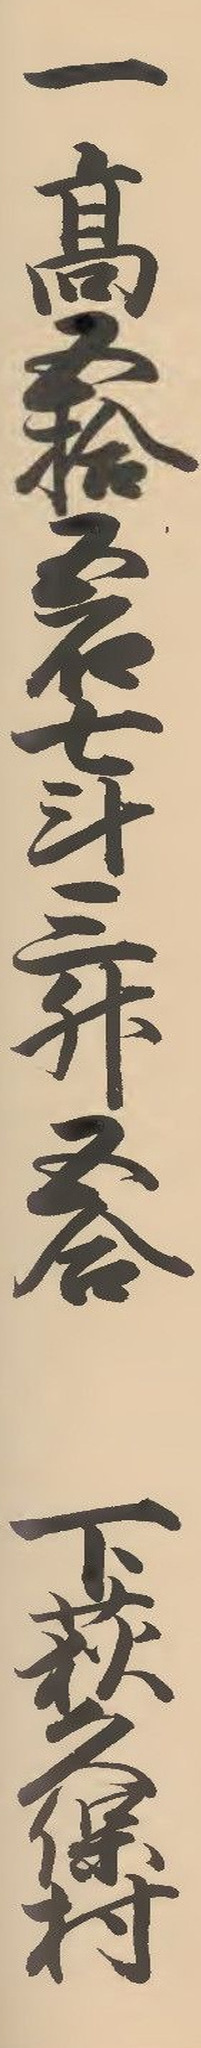一高五拾五石七斗三升五合下萩久保村
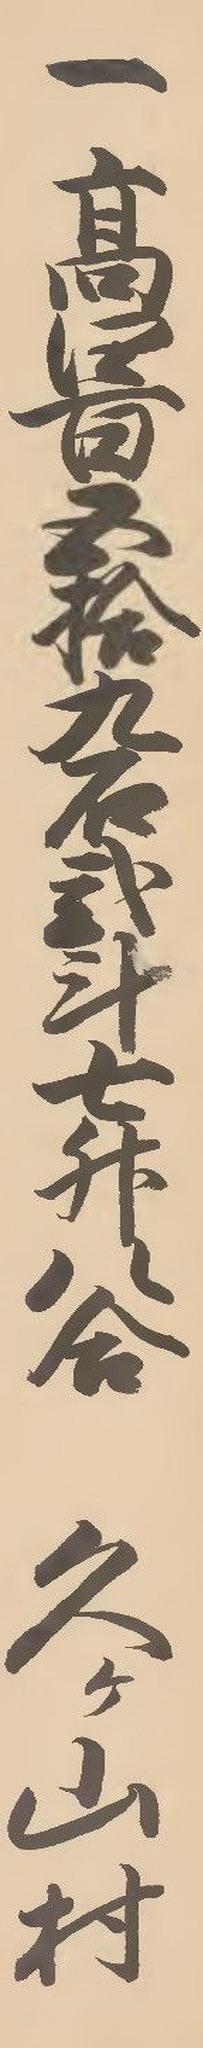一高四百五拾九石弐斗七升八合久ヶ山村
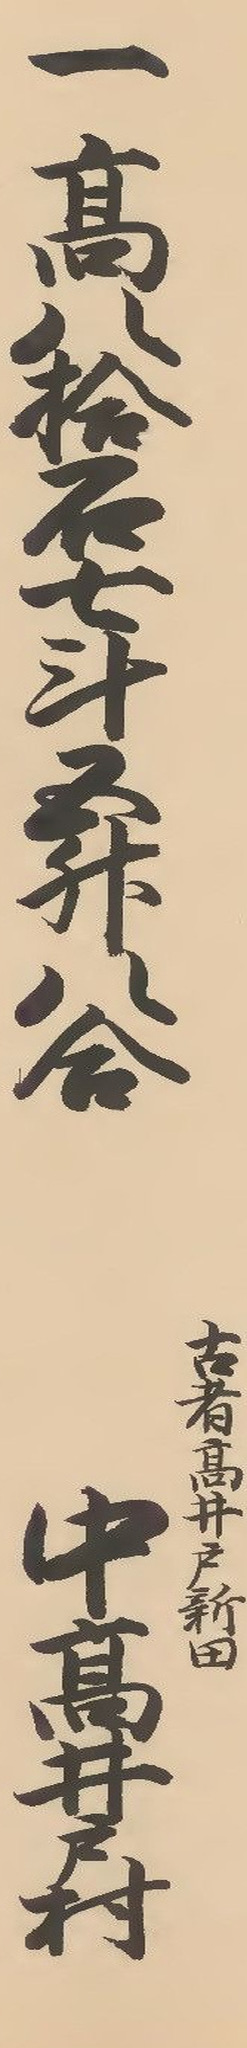一高八拾石七斗五升八合中高井戸村
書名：武蔵国郷帳　上
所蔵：国立公文書館 National Archives of Japan
